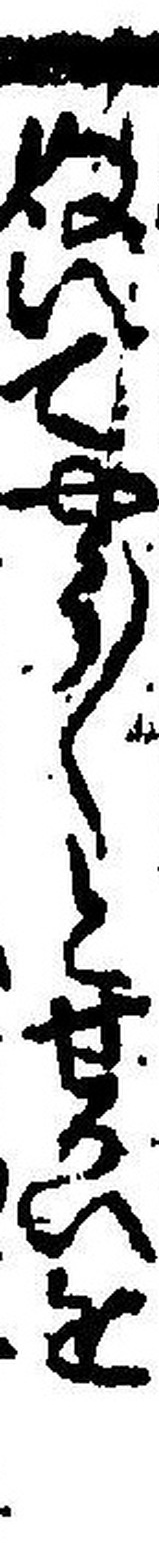ぬいてやう〳〵とせかいを
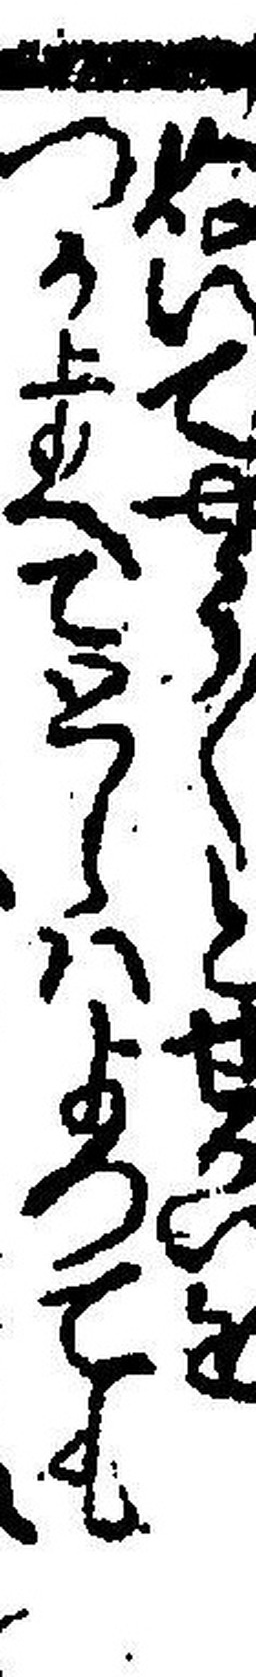つかまへてとしはよつても
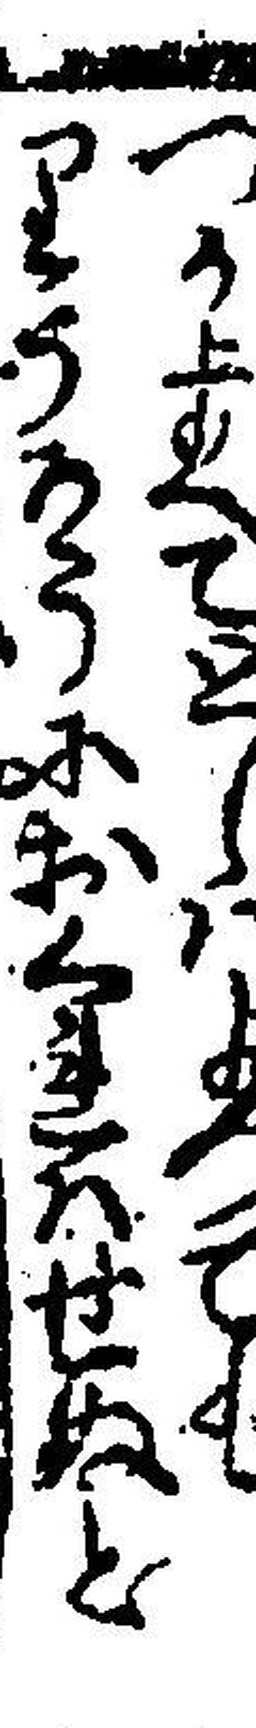りうかうにおくれはせぬと
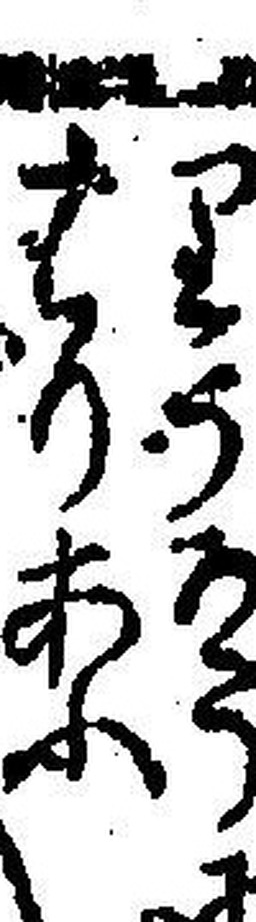はりあふ
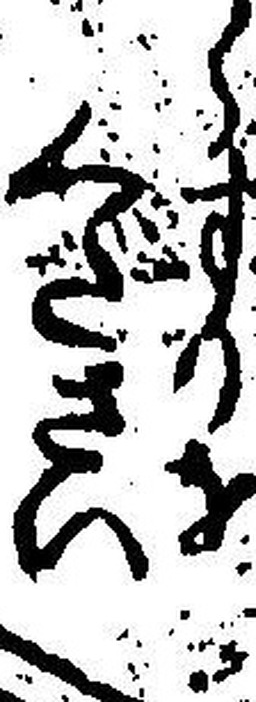ください
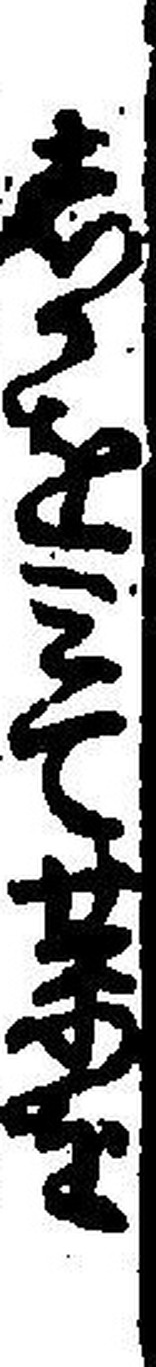しかをみて薬を
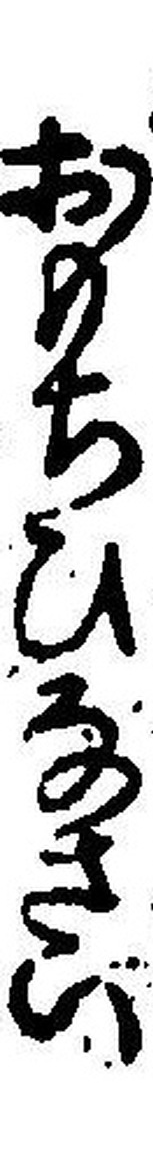おもちひなさい
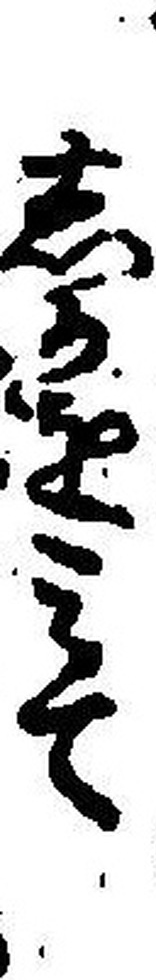しかをみて
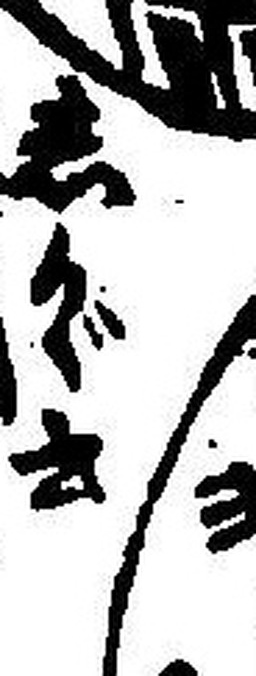しかゞ云
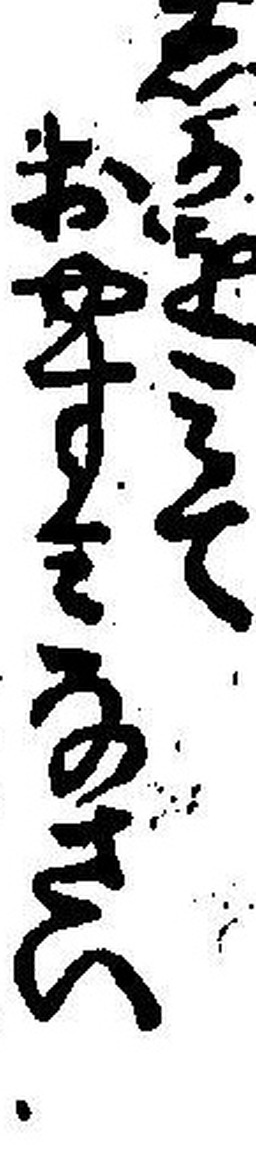おやすみなさい
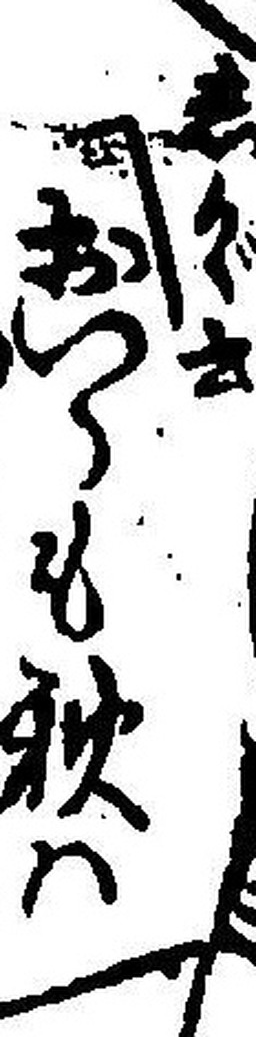〽おいらも秋は
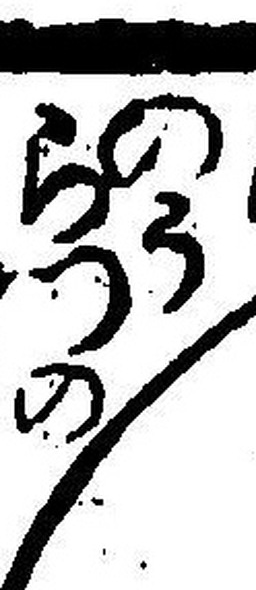ら門の
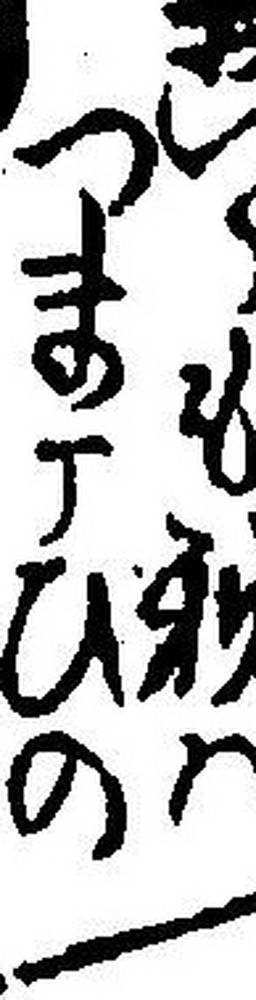つまとひの
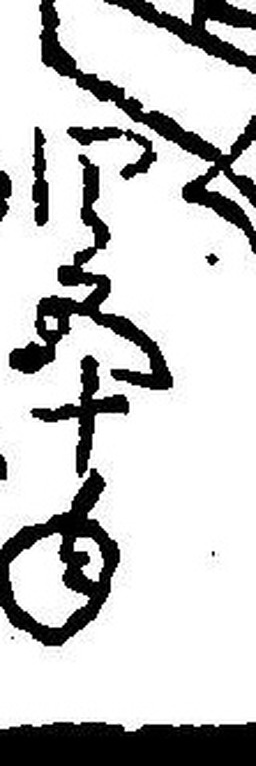四五十年
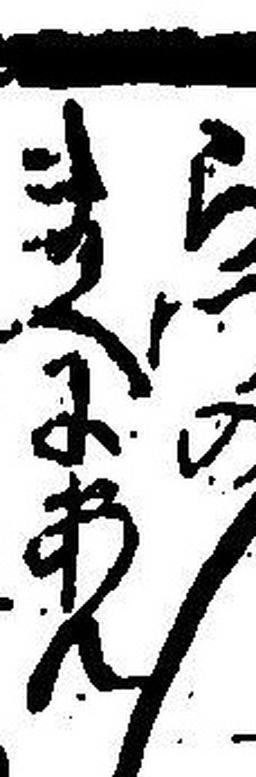まへにあん
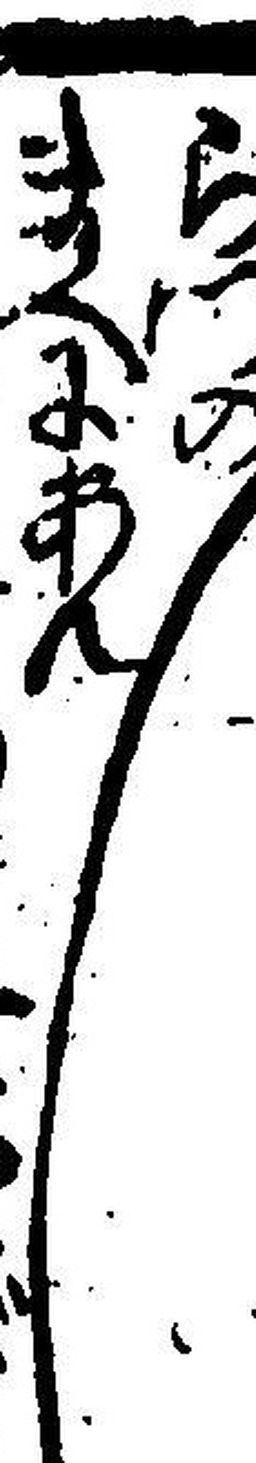まへにあん
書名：徳若水縁起金性 / 樹下石上作
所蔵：東京大学総合図書館 General Library in the University of Tokyo, JAPAN
